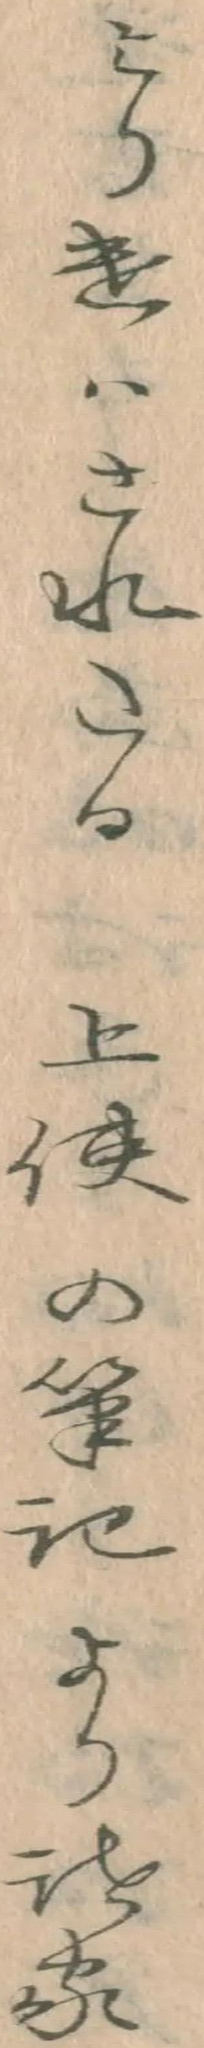より遣はされたる上使の筆記より諸家
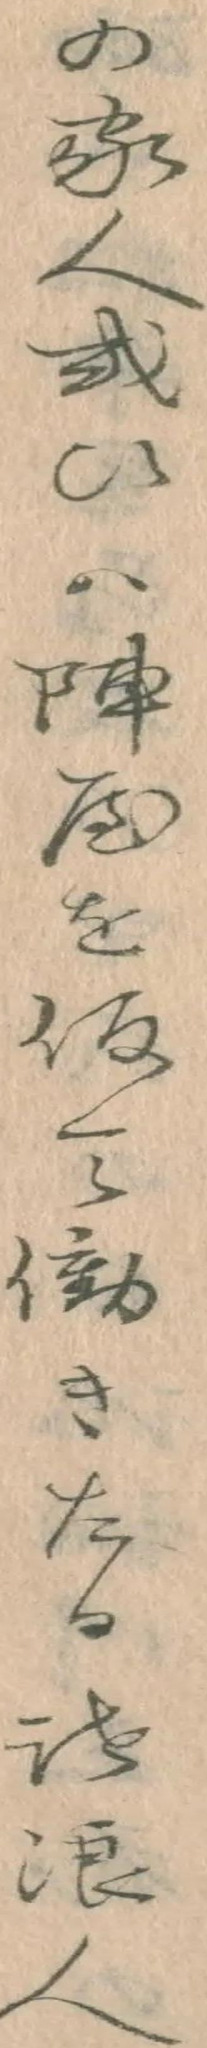の家人或ひは陣屋を仮て働きたる諸浪人
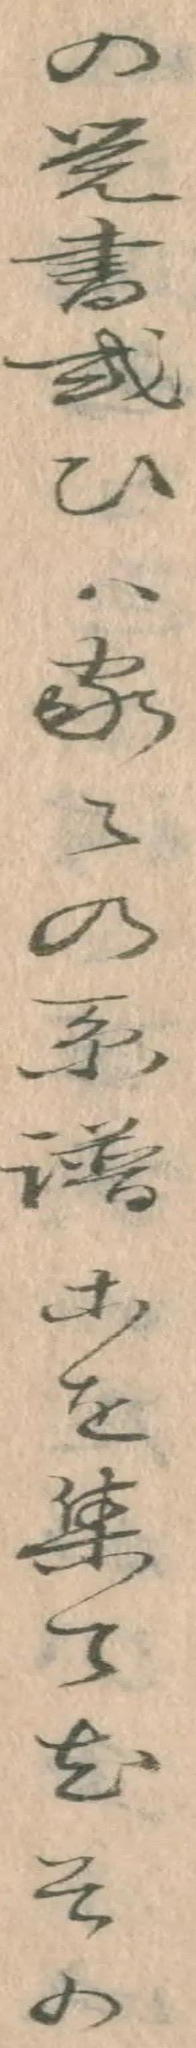の覚書或ひは家々の系譜等を集て尤その
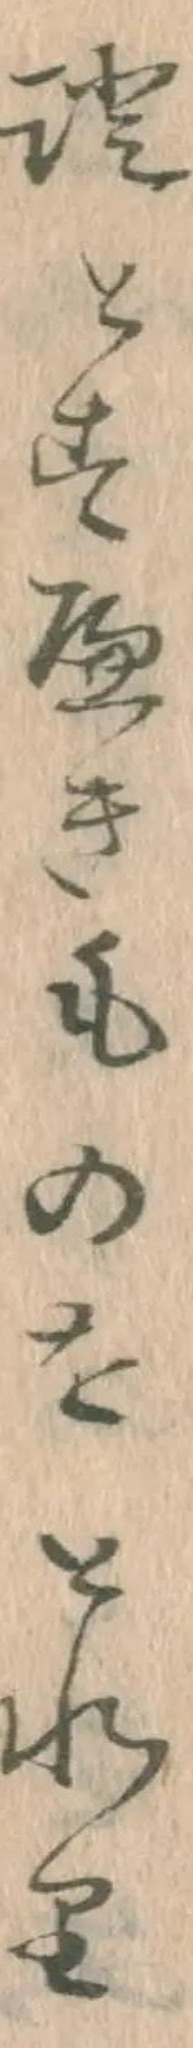証とすへきものをとれり
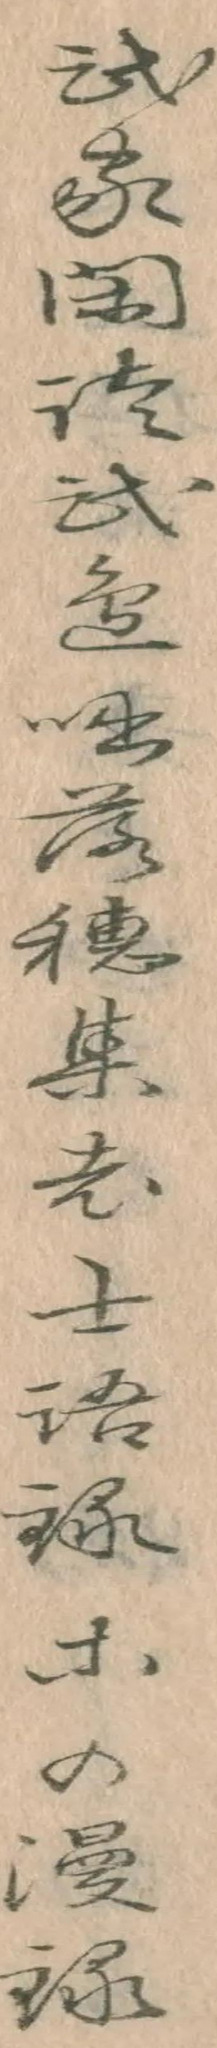一武家閑談武辺咄落穂集老士語録等の漫録
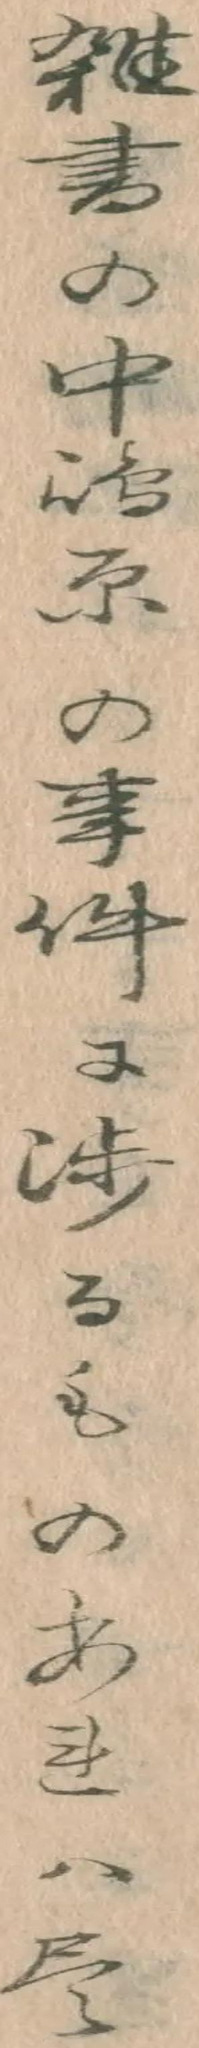雑書の中島原の事件に渉るものあれは尽
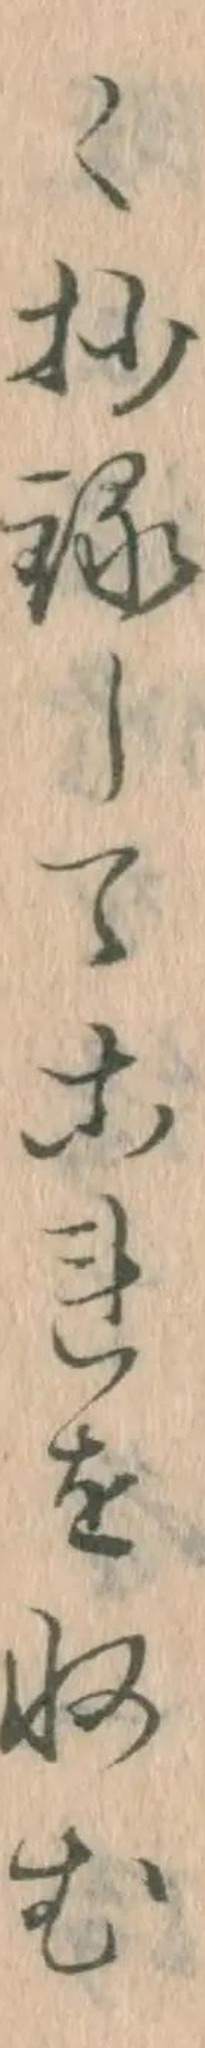く抄録してこれを収む
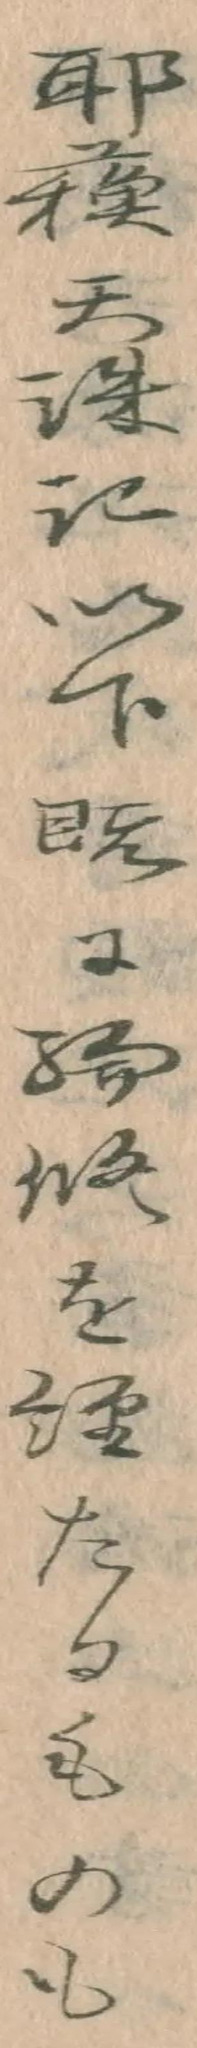一耶蘇天誅記以下既に編修を経たるものも
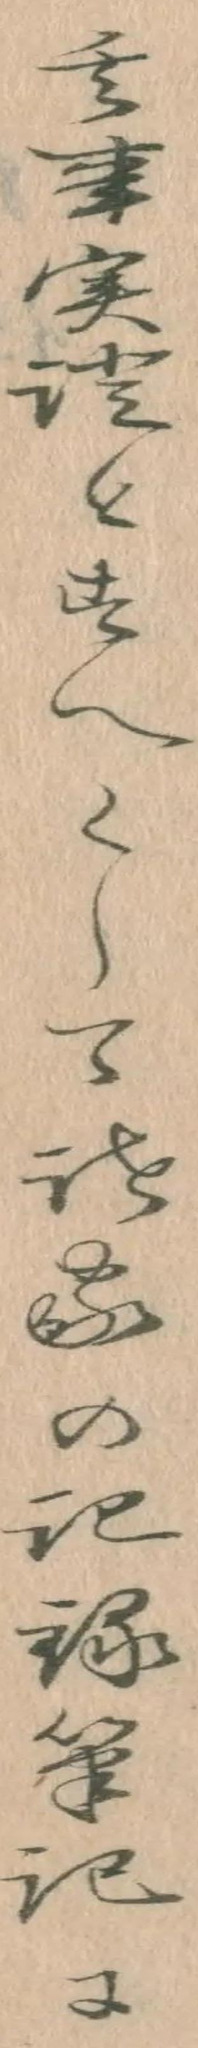其事実証とすへくして諸家の記録筆記に
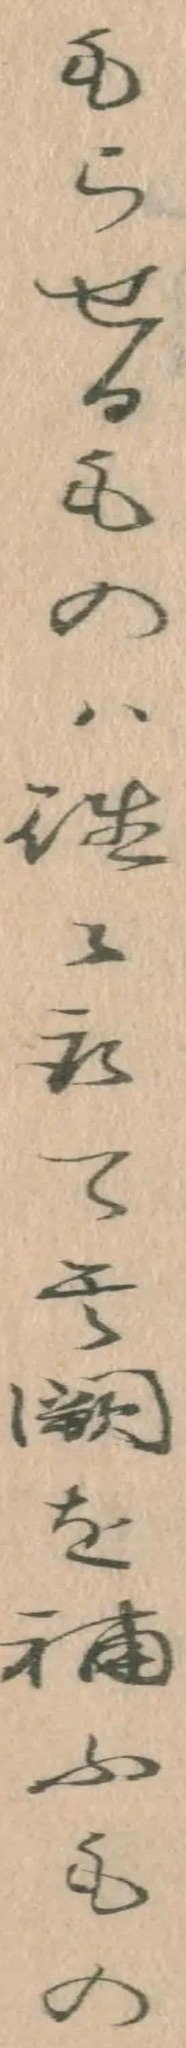もらせるものは往々取て其闕を補ふもの
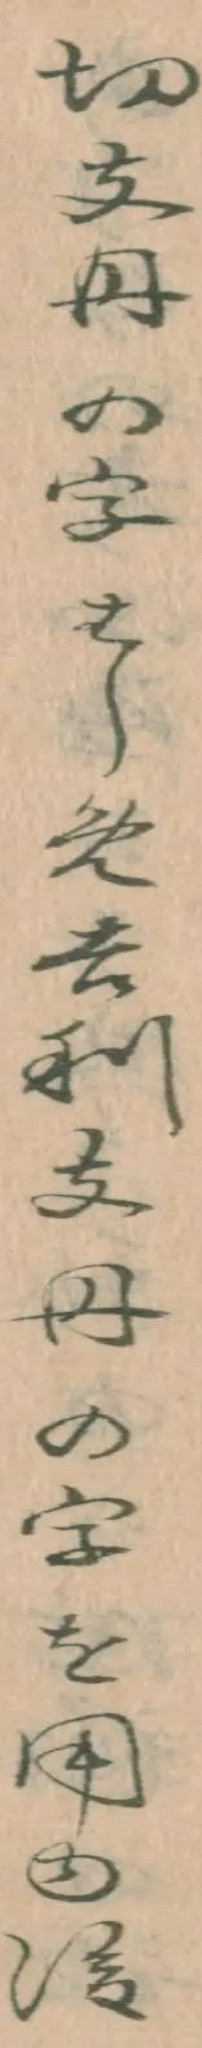一切支丹の字はしめ吉利支丹の字を用ゆ後
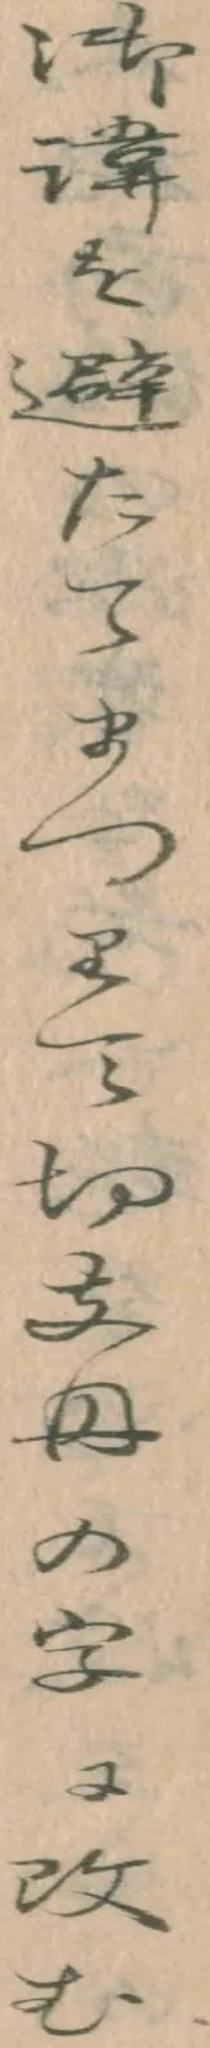御諱を避たてまつりて切支丹の字に改む
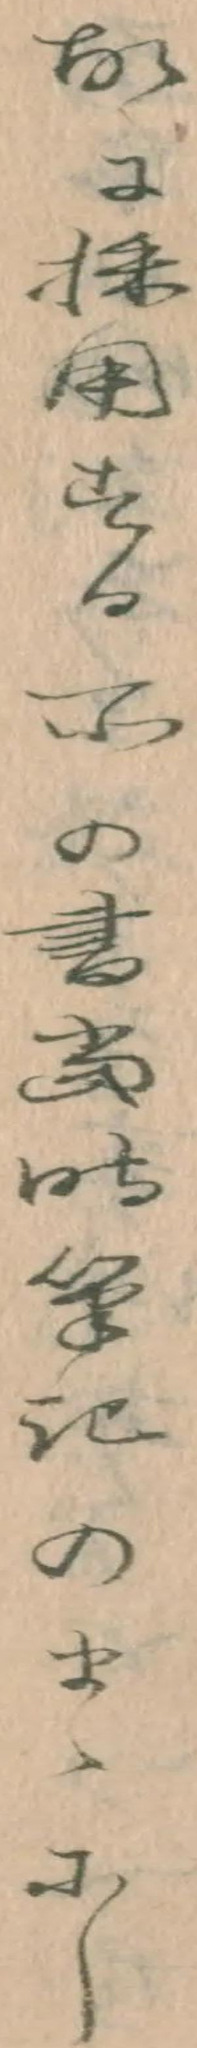故に採用する所の書当時筆記のまゝにし
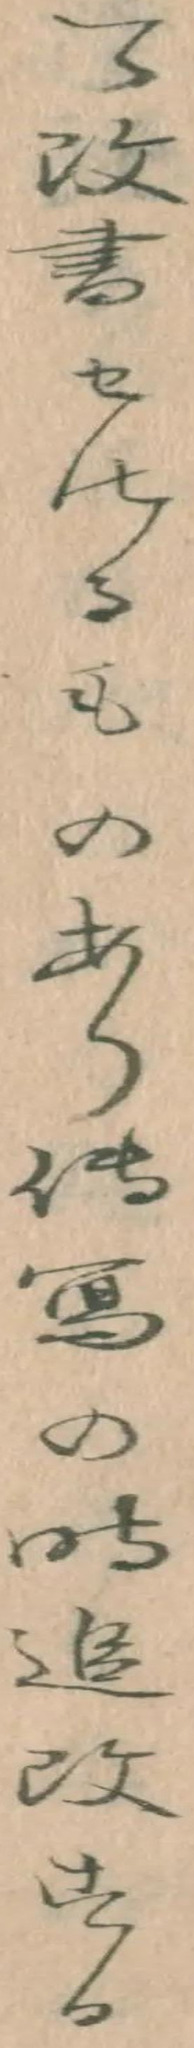て改書せさるものあり伝写の時追改する
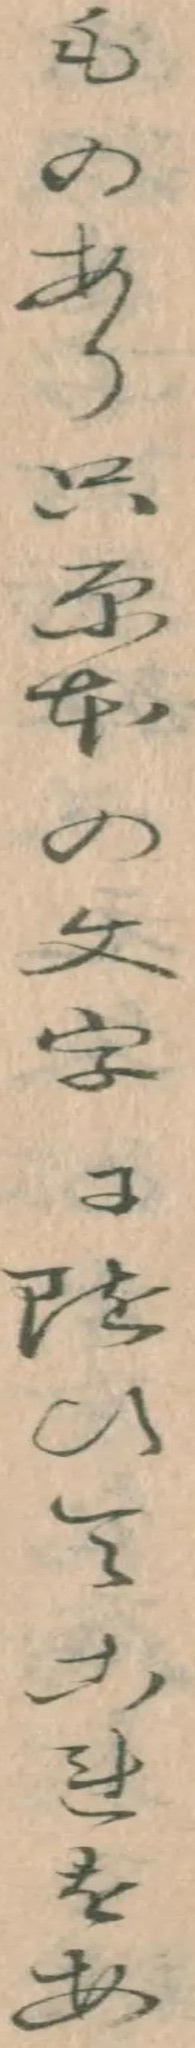ものあり只原本の文字に随ひてこれをあ
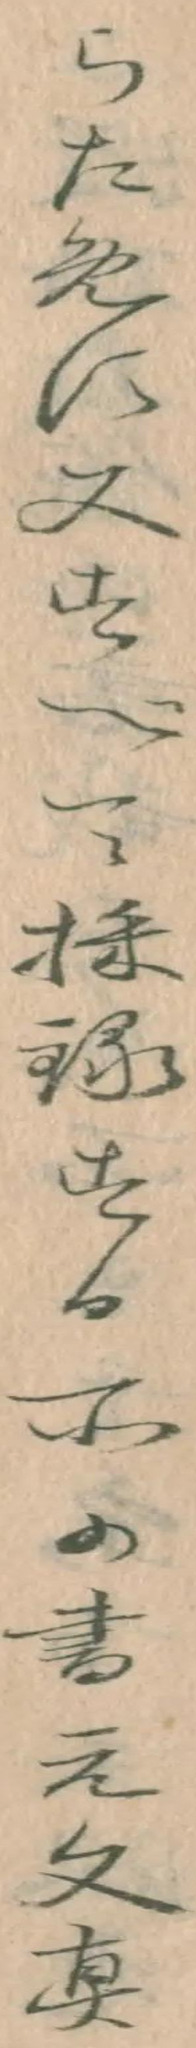らためす又すべて採録する所の書元文真
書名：切支丹御退治記 49巻. [1]
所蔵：国立国会図書館 National Diet Library, JAPAN
